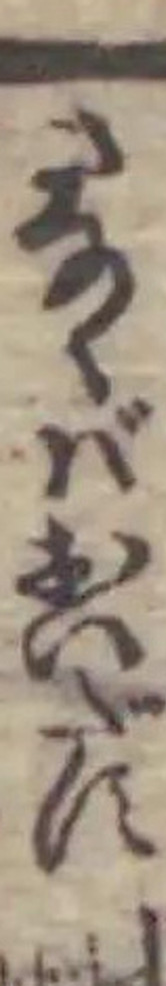さなくばおいだす
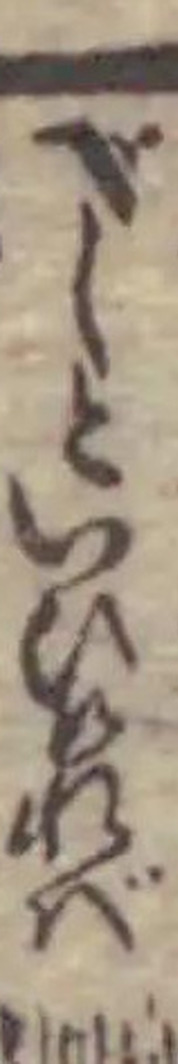べしといひければ
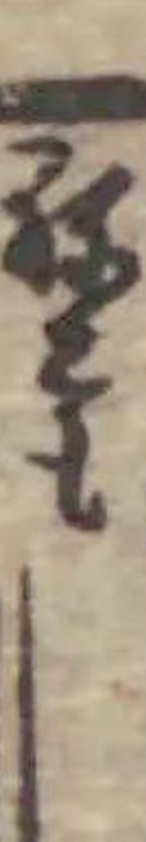ねこも
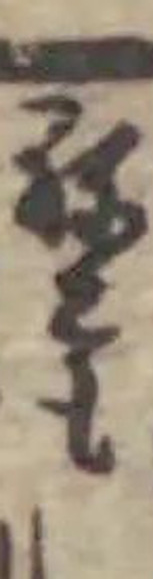ねこも
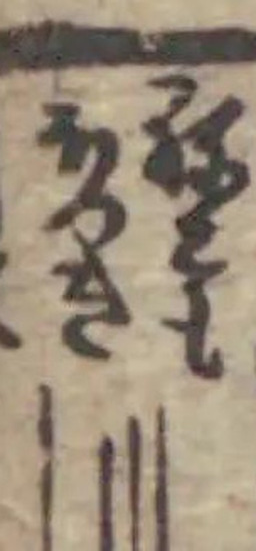ほつき
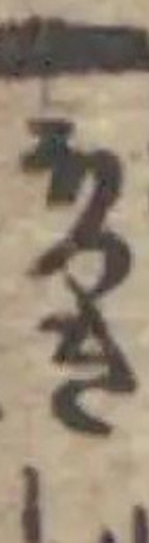ほつき
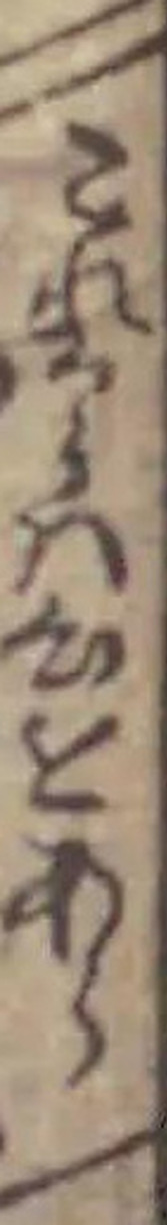これからは心をあら
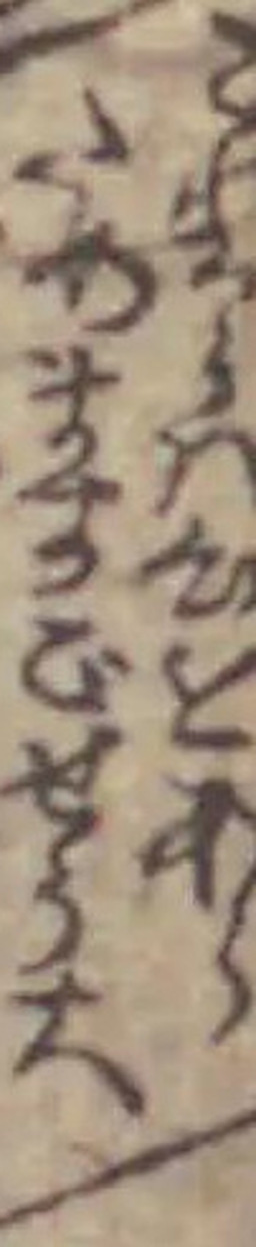ためますごせう大
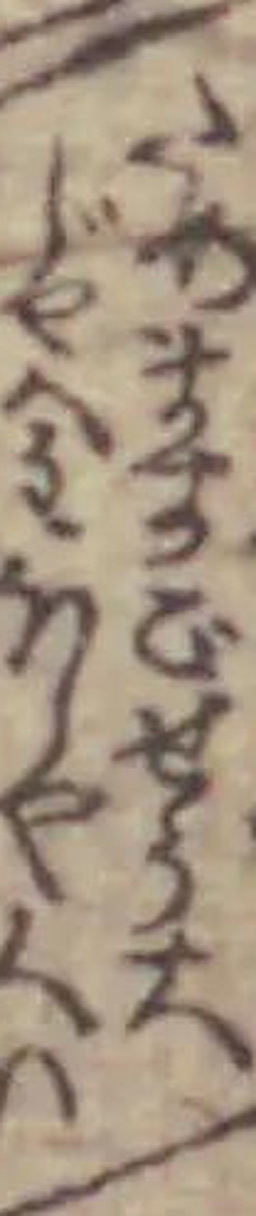じや金ほしや人は
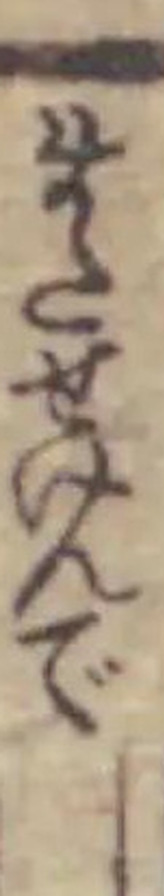またせけんで
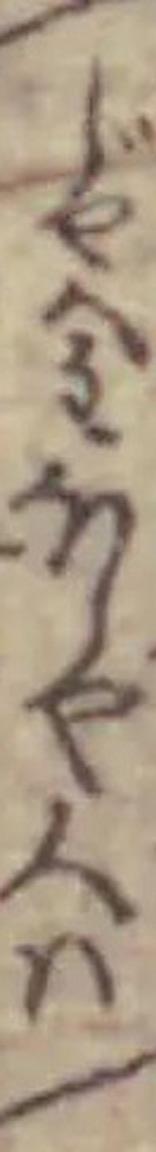じや金ほしや人は
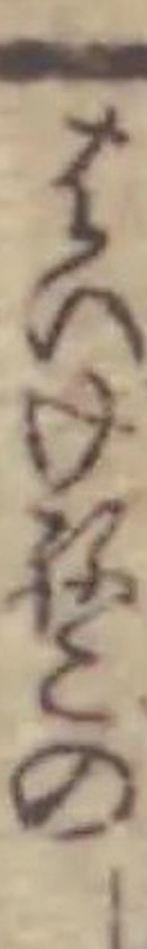はいげねこの
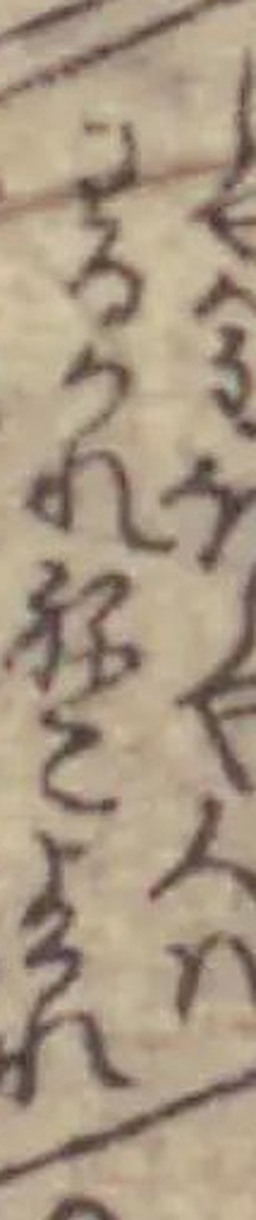わるかれねこよかれ
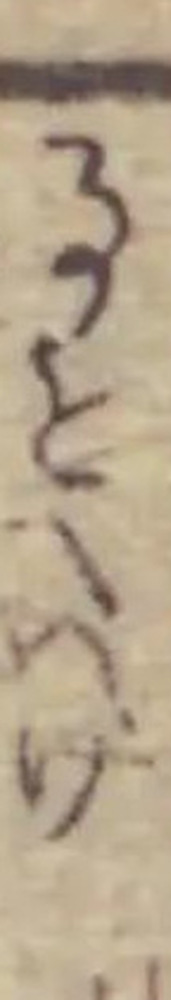事をへいけ
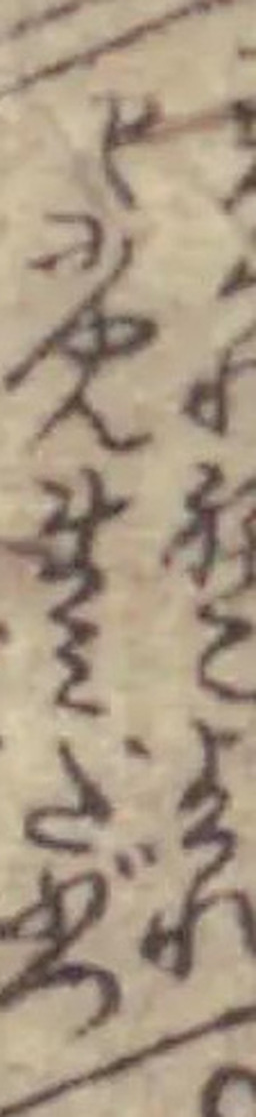アゝにやんまみだぶつ
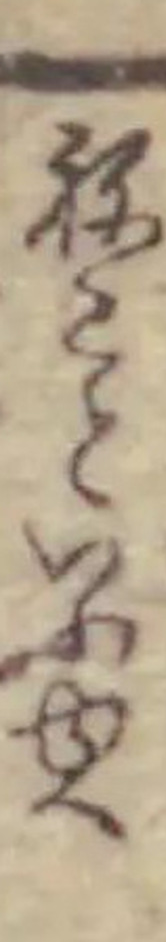ねこといふゆへ
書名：冷水灰毛猫 2巻
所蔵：国立国会図書館 National Diet Library, JAPAN
